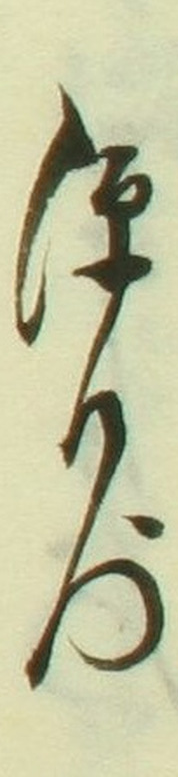源左衛門
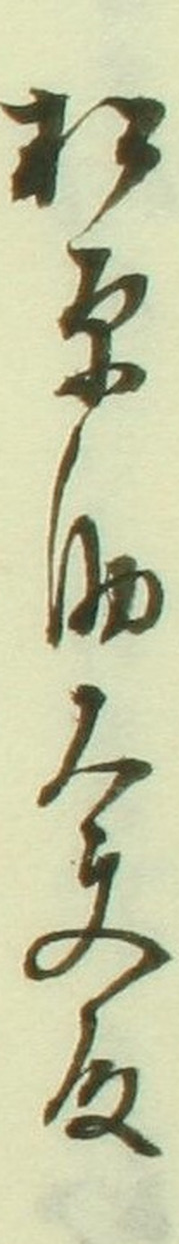松原助大夫殿
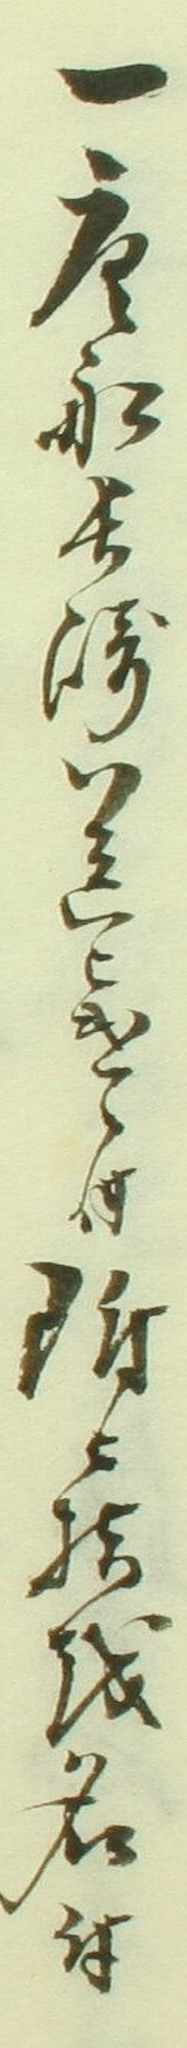一唐船長崎送被遣候付附被指越名付
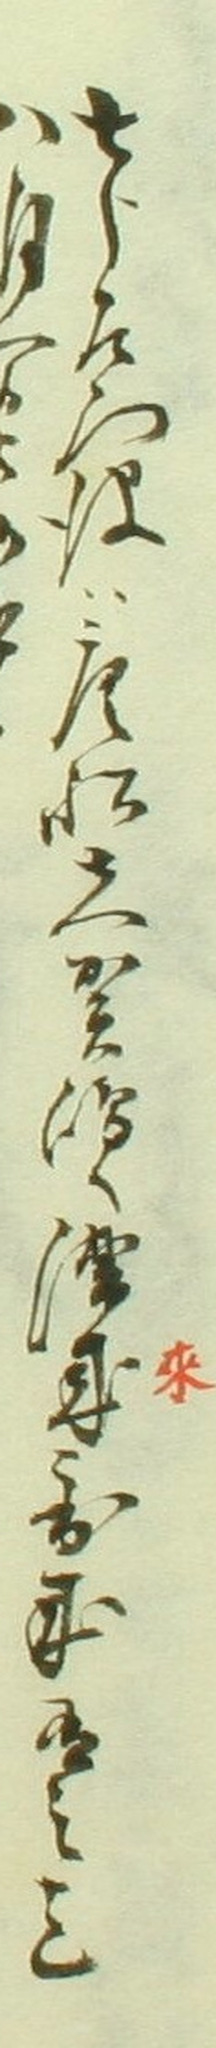七郎左衛門儀ハ唐船志賀嶋へ漂来到来有之迄
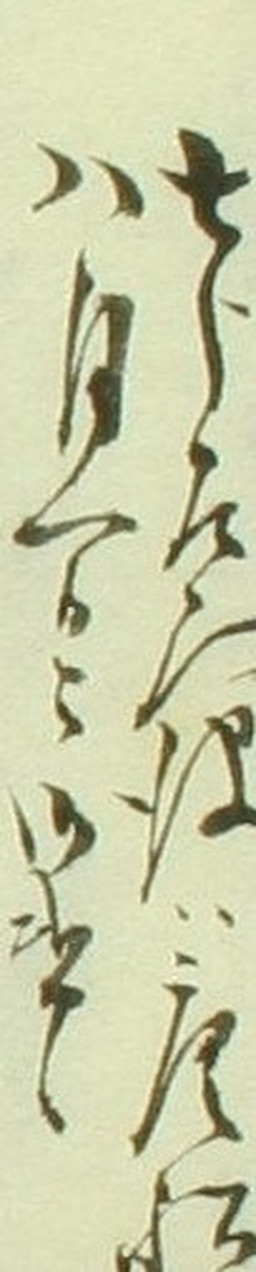八月一日ニ御遣候
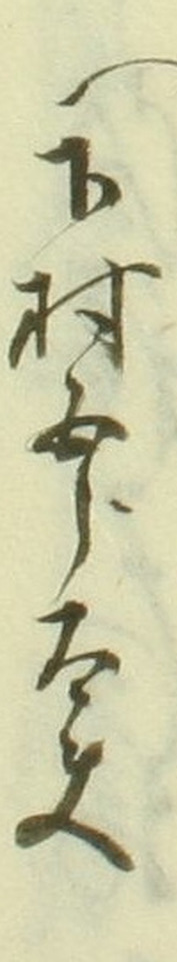下村五郎太夫
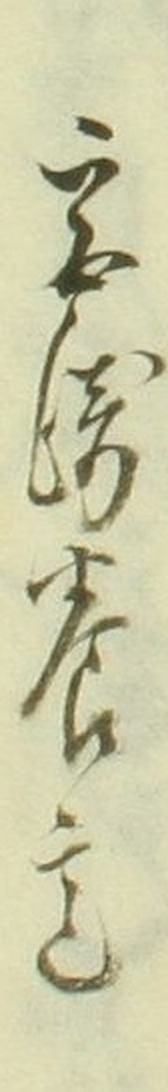宮崎養意
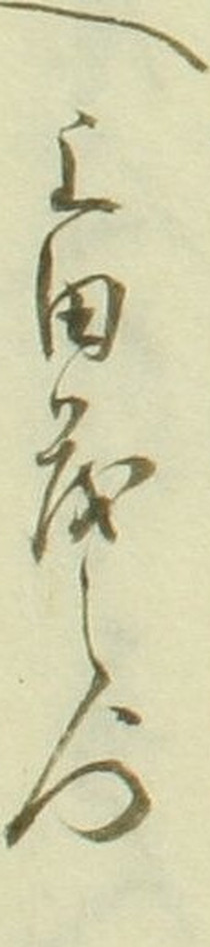上田茂右衛門
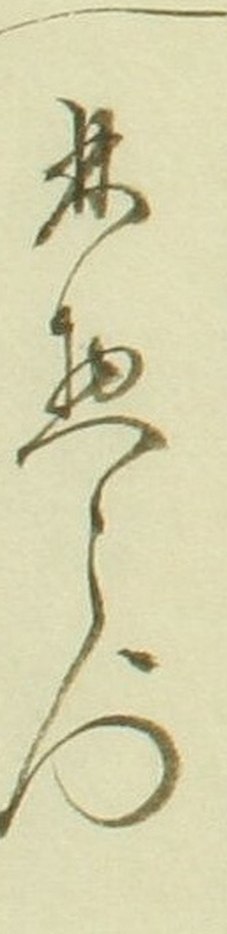林惣右衛門
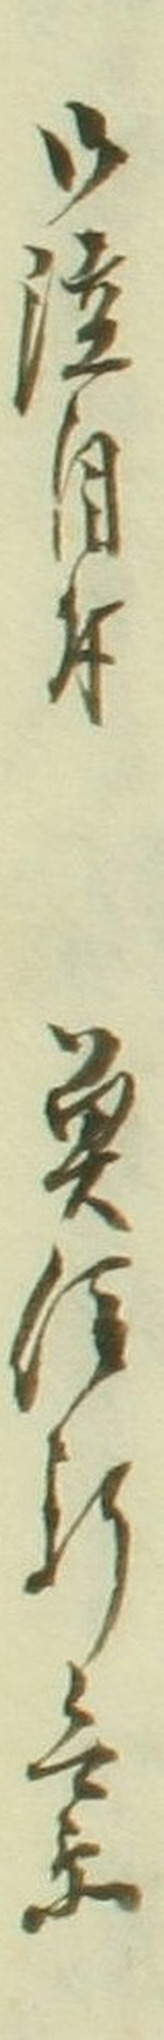御陸目付魚住新兵衛
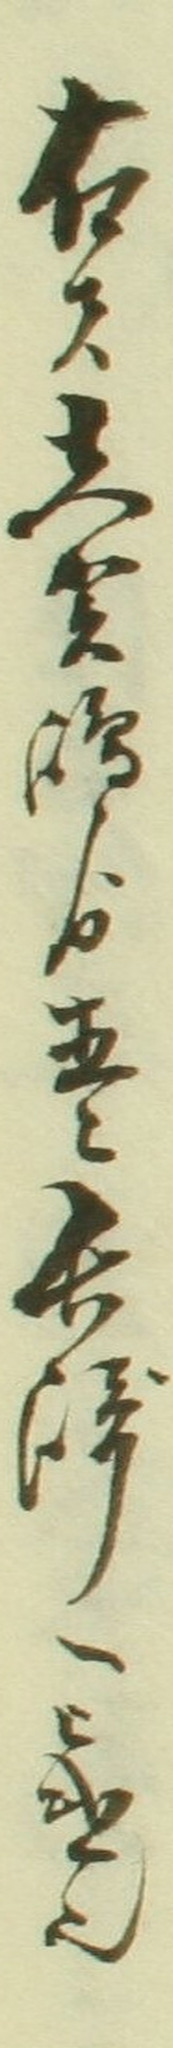右者志賀嶋ゟ直ニ長崎へ被遣也

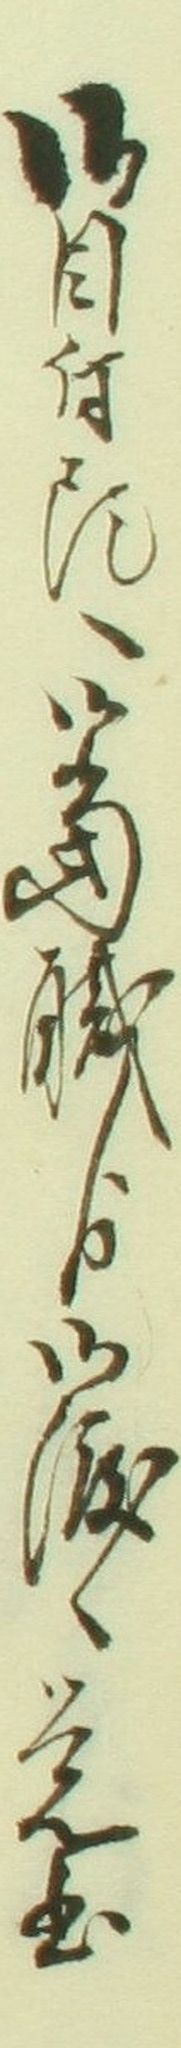御目付頭へ御当職ゟ御渡候覚書
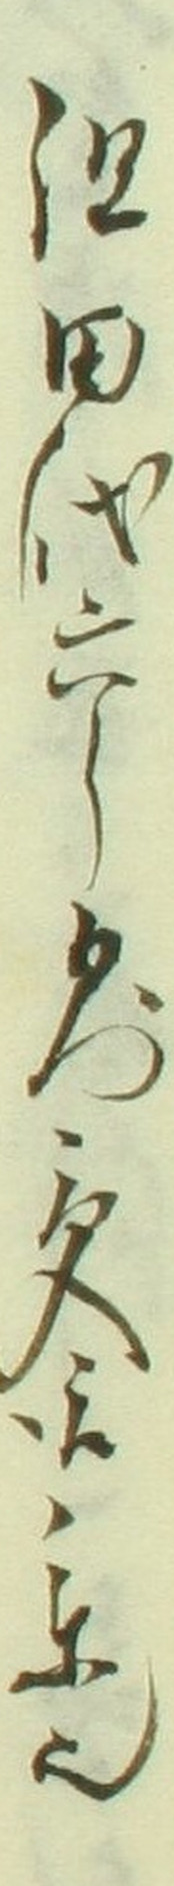但田代六郎右衛門受取参也
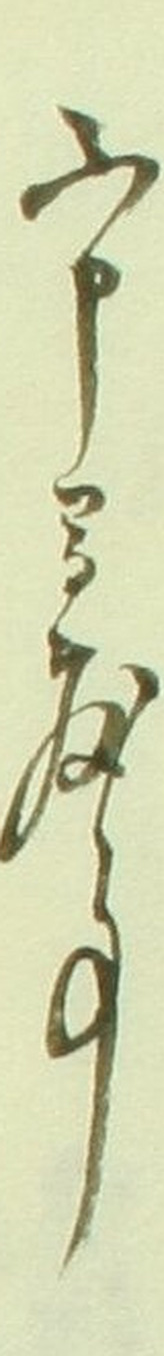不申間敷事
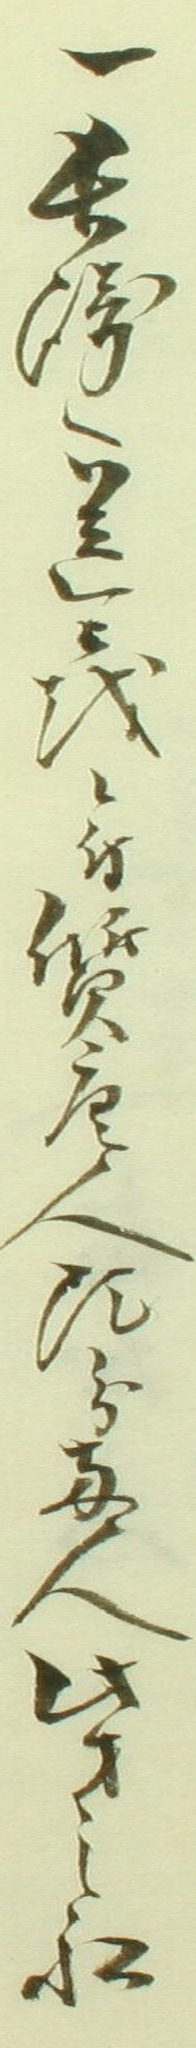一長崎へ送越ニ付質唐人頭分両人此方之船
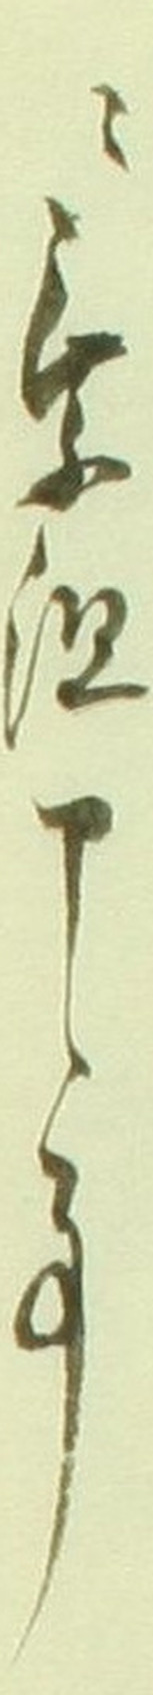二乗組申候事
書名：異国船漂着記
